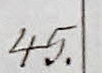45.
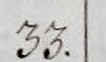33.
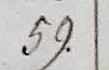59.
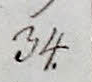34.
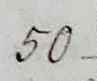50
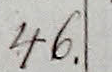46.
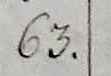63.
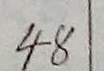48
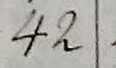42
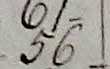56
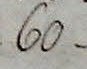60
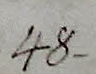48
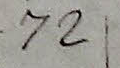72
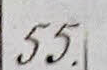55.
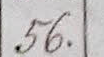56.
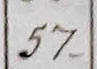57
